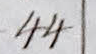44
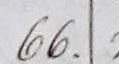66.
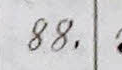88.
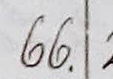66.
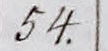54.
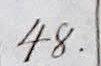48
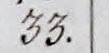33.
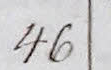46
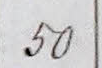50
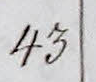43
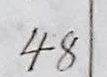48
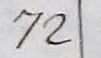72
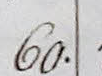60.
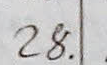28.
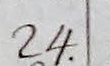24.
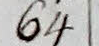64
